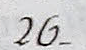26
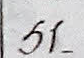51
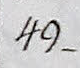49
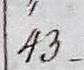43
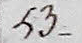53
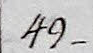49
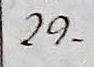29
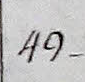49
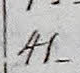41
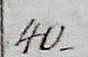40
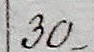30
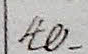40
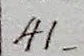41
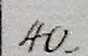40
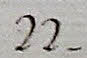22
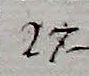27
